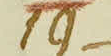19
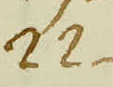22
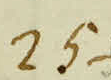25
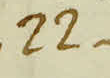22
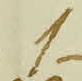1
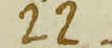22
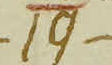19
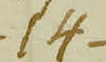14
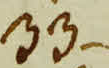33
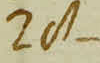28
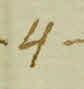4
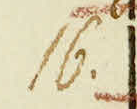16.
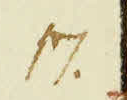17.
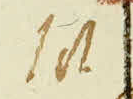18.
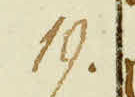19.
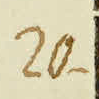20
